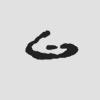㠯（以）
